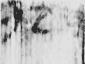九
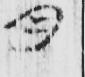月
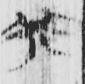癸
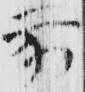亥
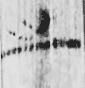之
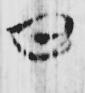日
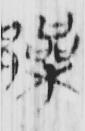鄵
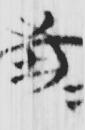市
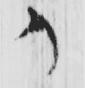人
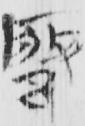○（殷）
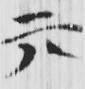亓（其）
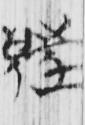○（兄）
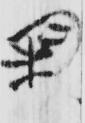朔
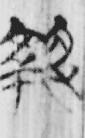執
